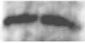一
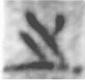之
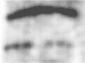二
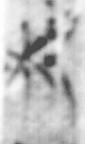厀（漆）
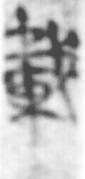載
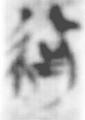紫
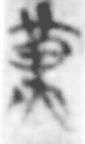黃
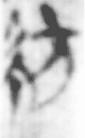紡
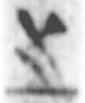之
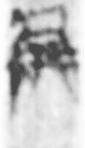綳
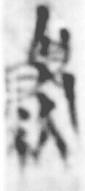顯（韅）
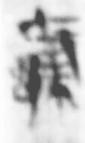鞅
